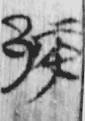○（侯）
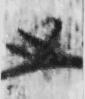之
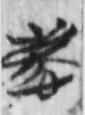慶
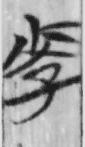李
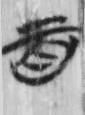百
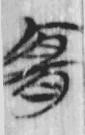宜
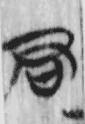君
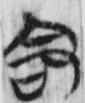命
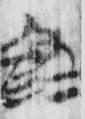爲
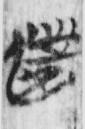○（僕）
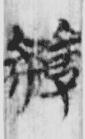搏（捕）
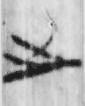之
